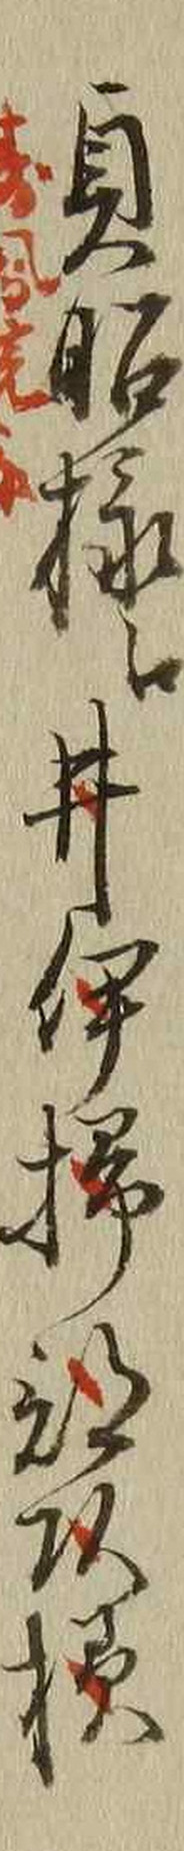貞昭様江井伊掃部頭様
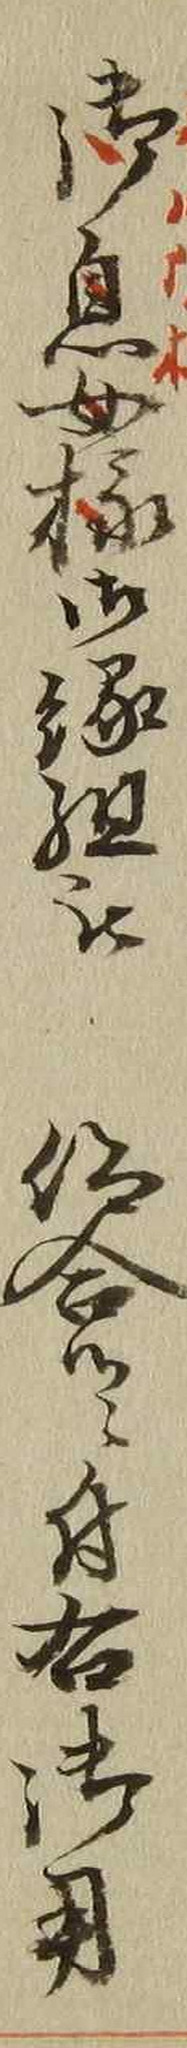御息女様御縁組被仰合候ニ付右御用
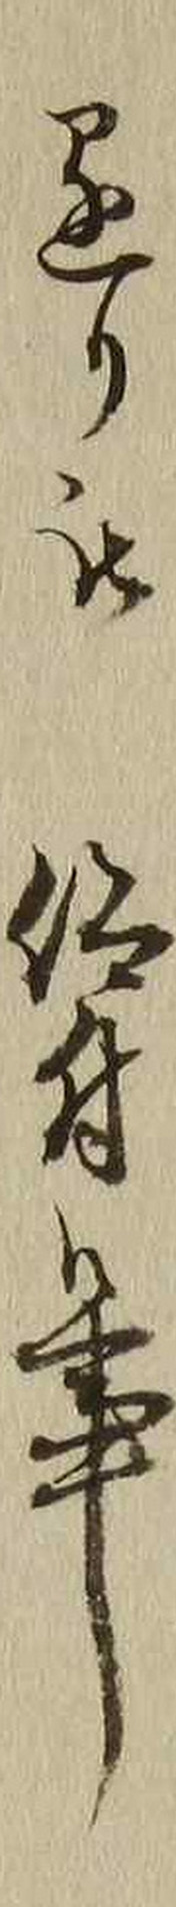懸り被仰付候事
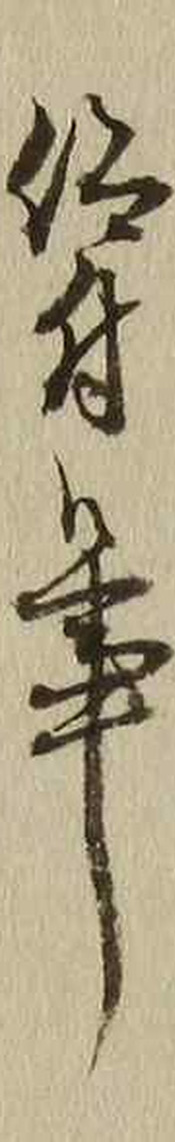仰出候事
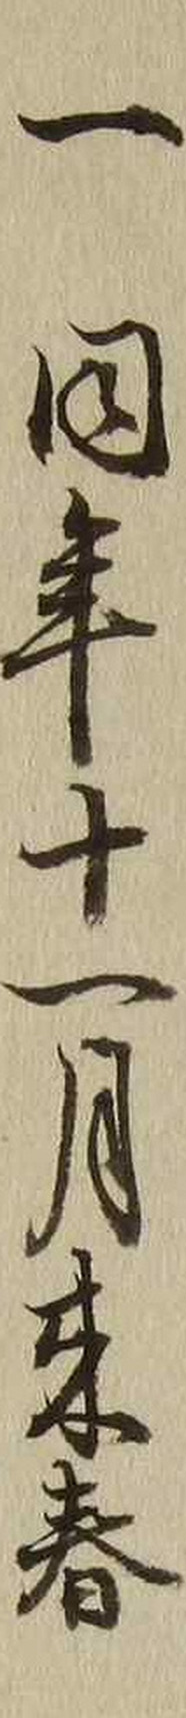一同年十一月来春
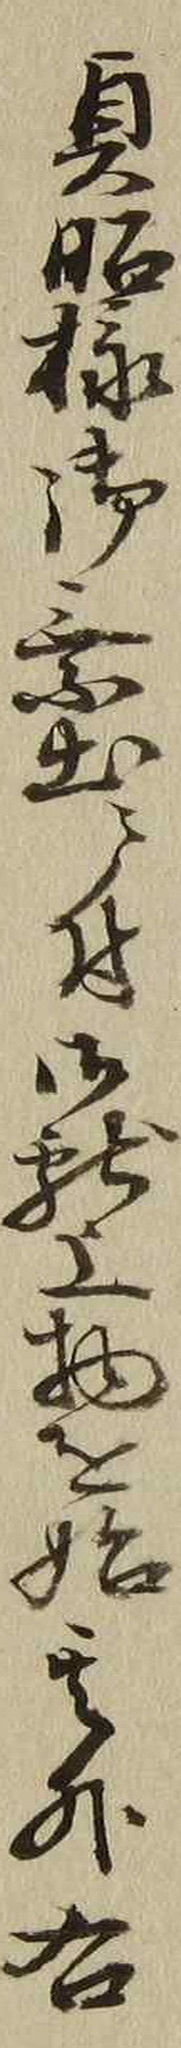貞昭様御乗出ニ付御献上物を始其外右
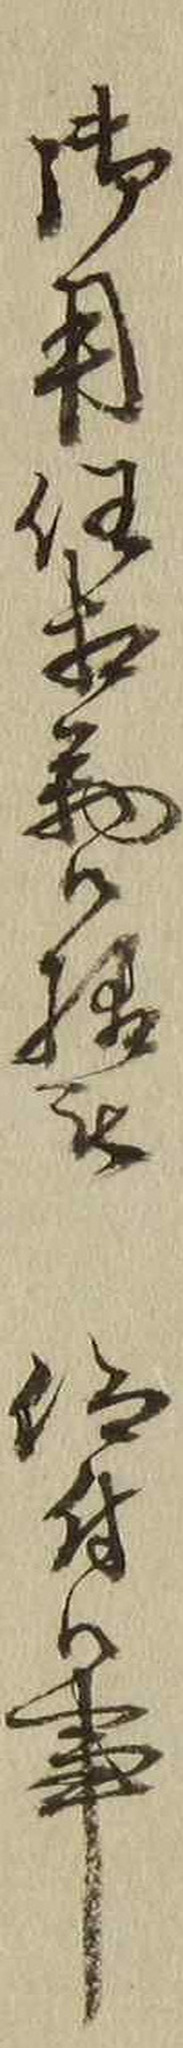御用任相勤候様被仰付候事
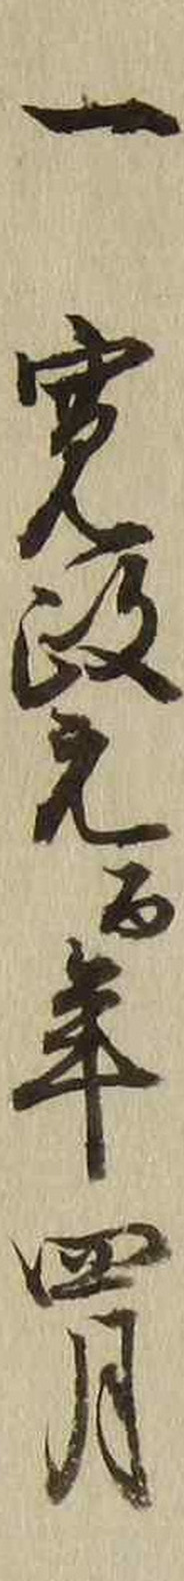一寛政元酉年四月
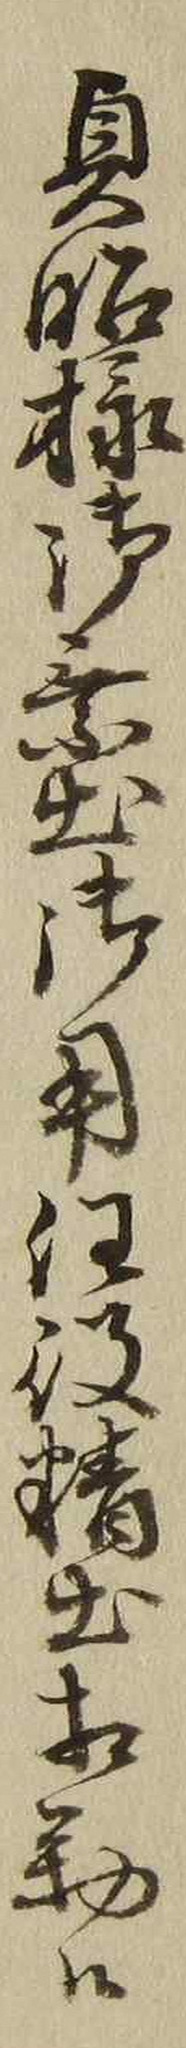貞昭様御乗出御用任役精出相勤候
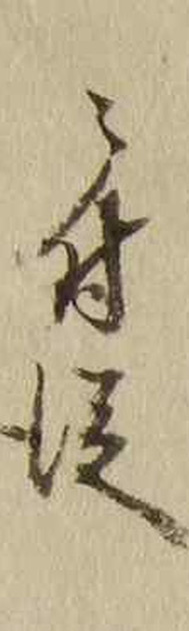ニ付従

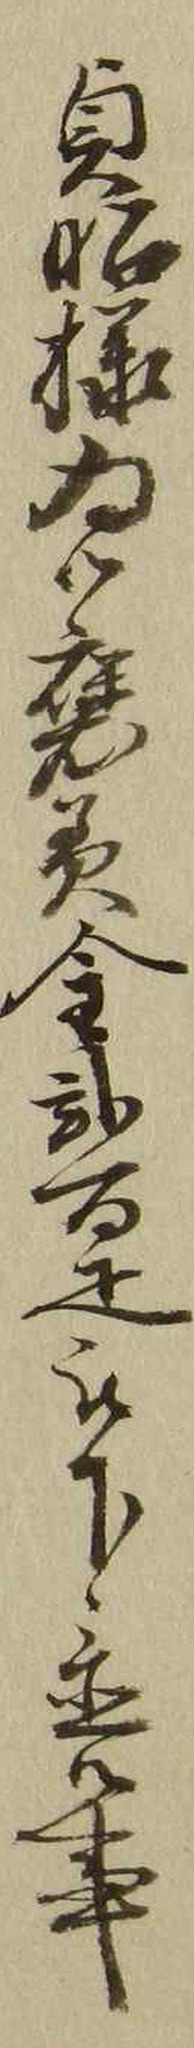貞昭様為御褒美金弐百疋被下置候事
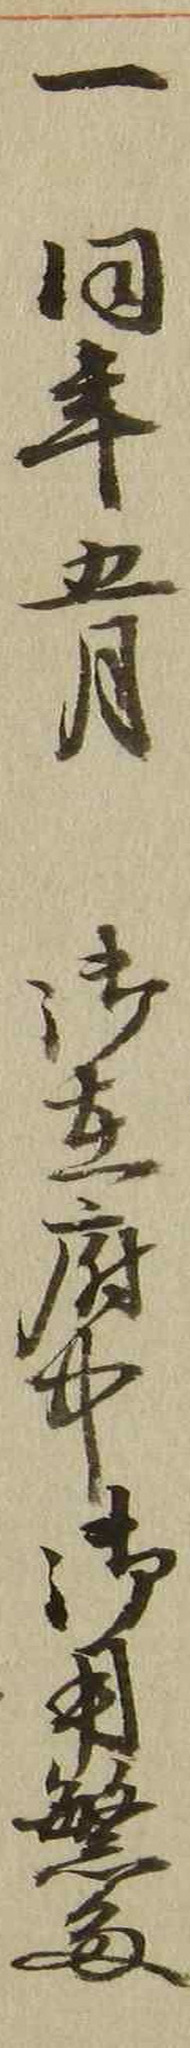一同年五月御在府中御用繫多
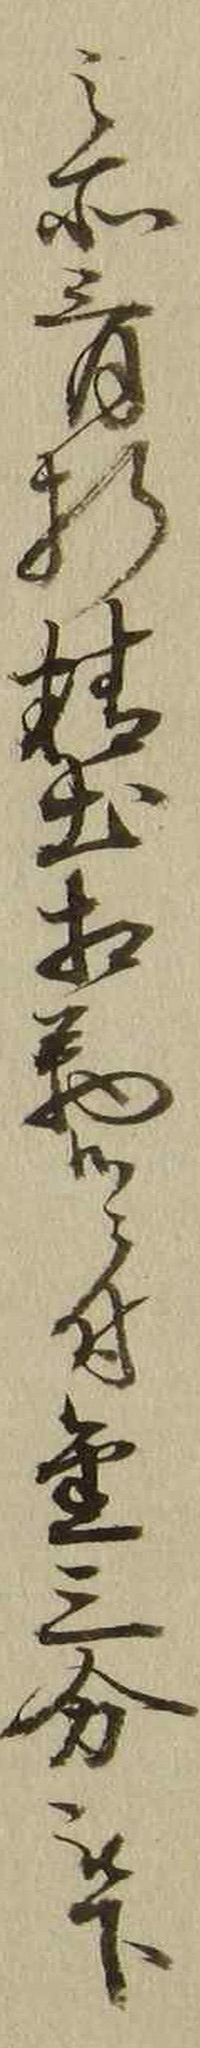之所骨折精出相勤候ニ付金三分被下
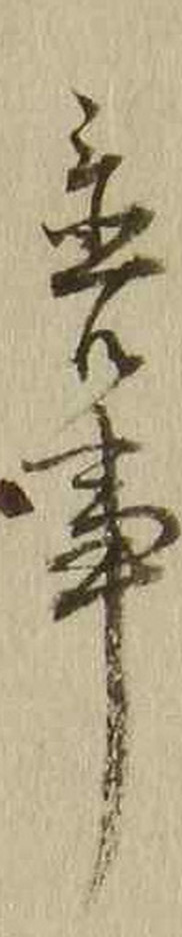置候事
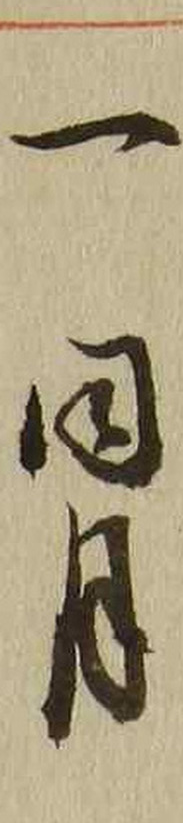一同月
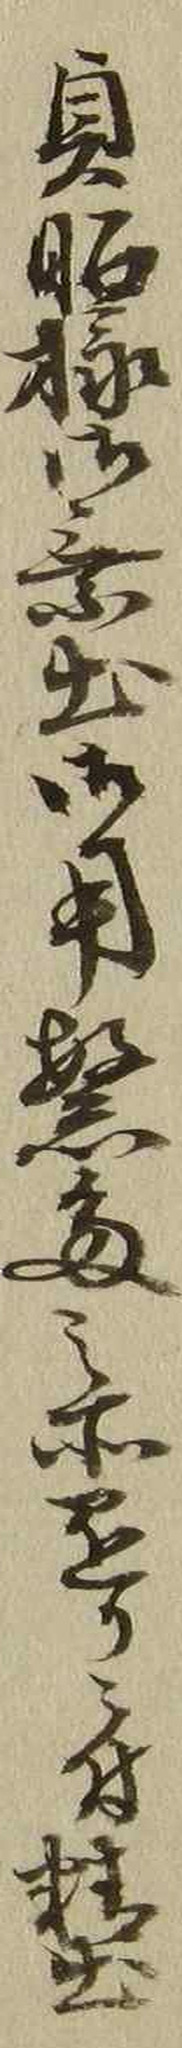貞昭様御乗出御用繫多之所懸りニ付精出
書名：諸士系譜　巻之64　と之部7
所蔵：会津若松市立会津図書館
